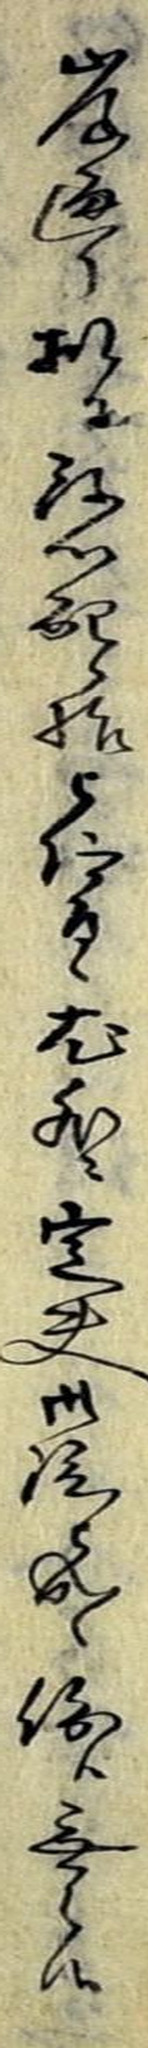岸通り揚而致心配候様被仰付候尤外に定夫御渡被成候儀は無之候
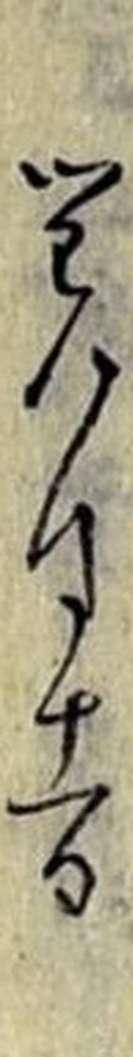閏八月十一日
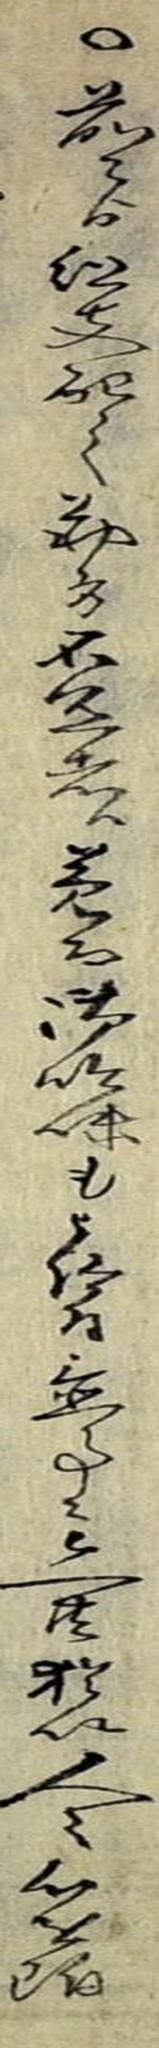○前々ゟ組支配之勤方不宜者は兼而御吟味も被仰付置事に候へ共猶以人々心を附
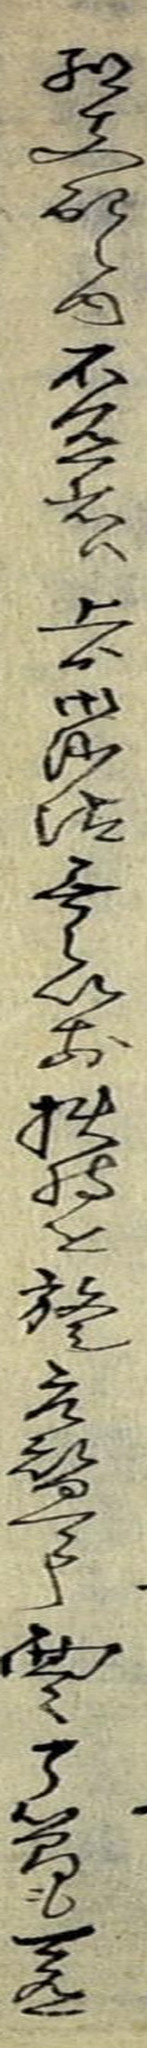組支配之内不宜者は上ゟ御沙汰無之以前扶持を放し取替可申面々了簡も可有
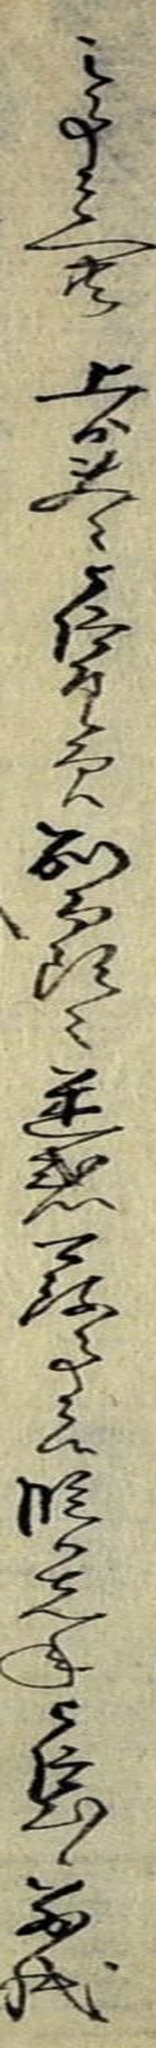之事に候へ共上ゟ夫々被仰付而は別而頭々迷惑可致事に候段は先年被仰出候別紙
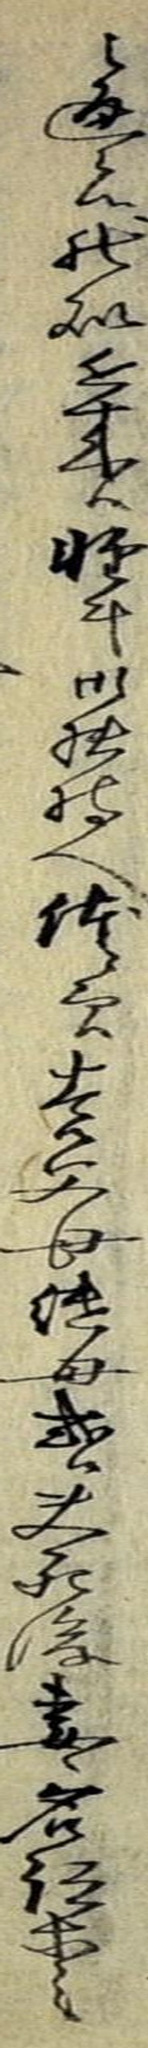之通に候然処近来は軽キ御扶持人体に而は養父母継母或は夫死後妻へ名位等之
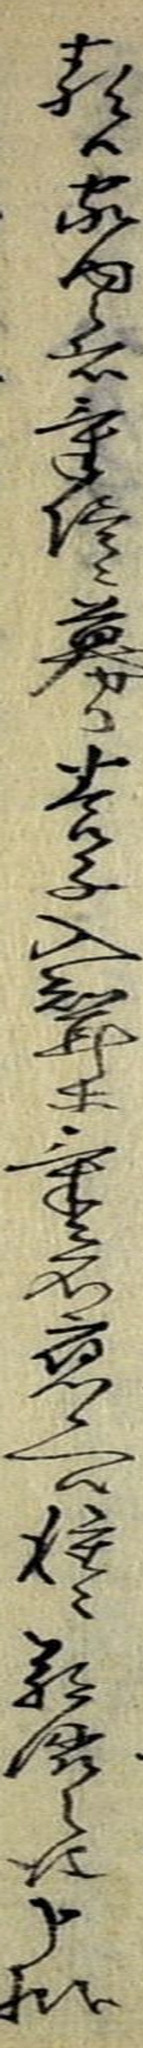類は家内之者気儘に募り養子入聟等気に不応候へは種々難渋之儀申掛
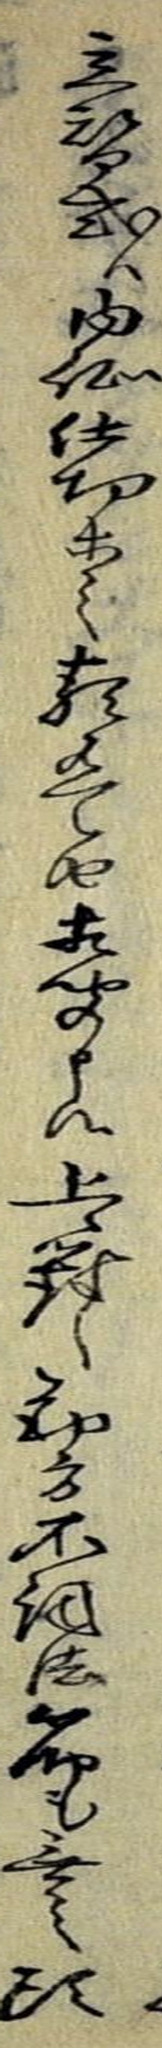立替或は内証仕切等之類有之由相聞申候上に対し勤方不調法筋も無之頭
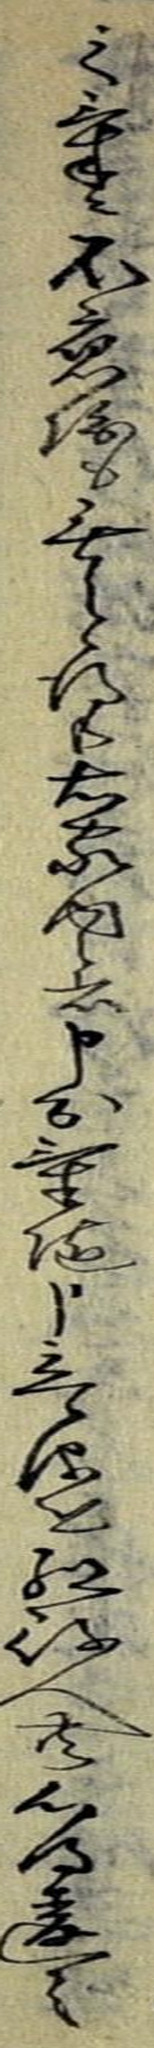之気に不応儀も無之候得共右家内之者申分気隋申立候儀を組役人共心得違之
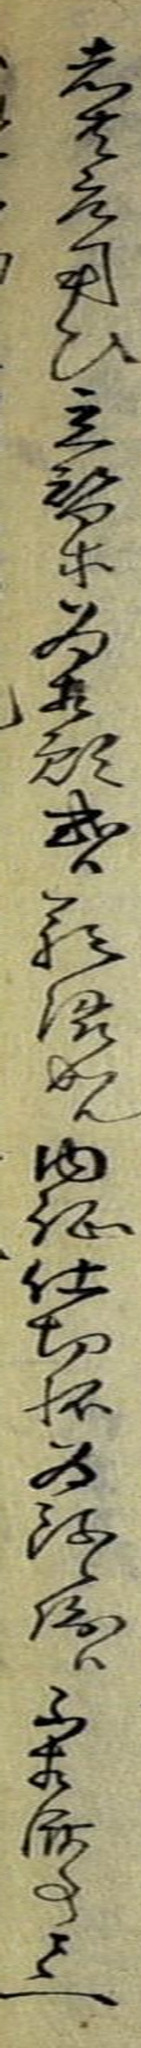者共取用ひ立替等為相願或は難渋成ル内証仕切抔為致候儀は不相済事に候へ
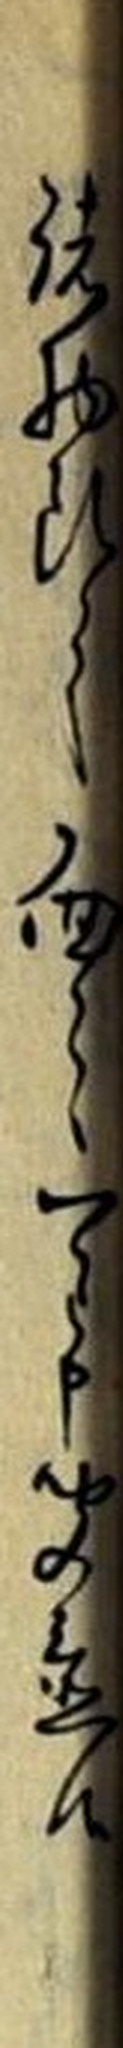諸物頭之面々へ可申聞置候
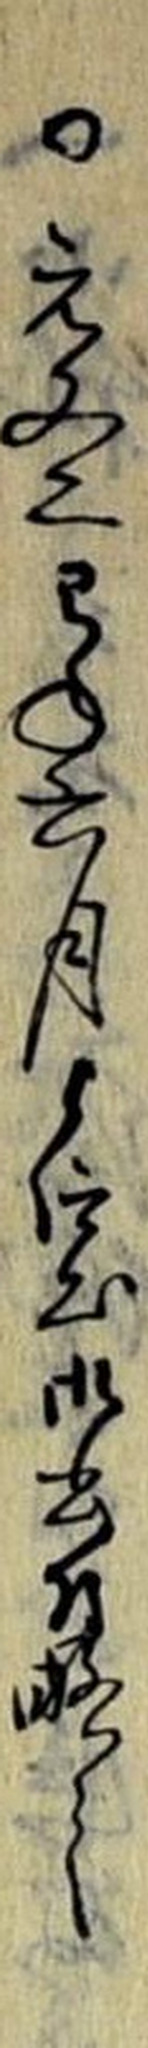○元文二巳年六月被仰出御書付略之
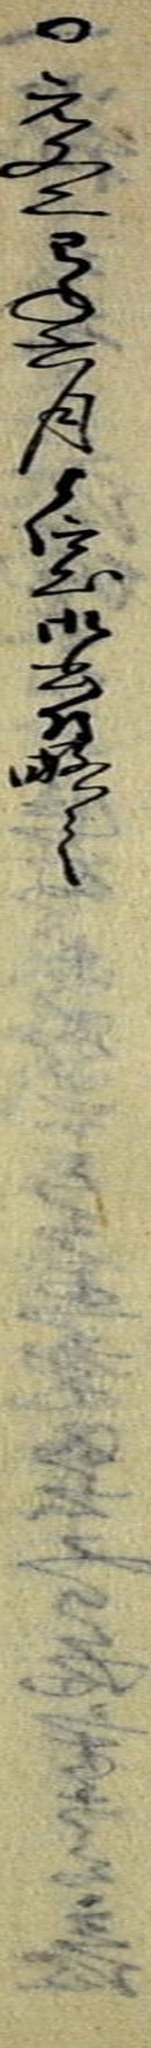○元文二巳年六月被仰出御書付略之
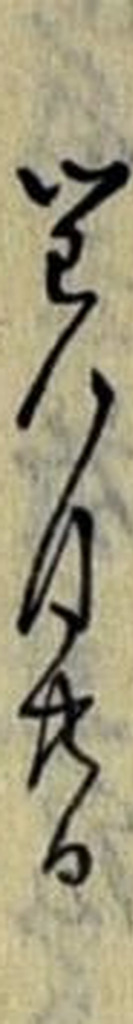閏八月廿日
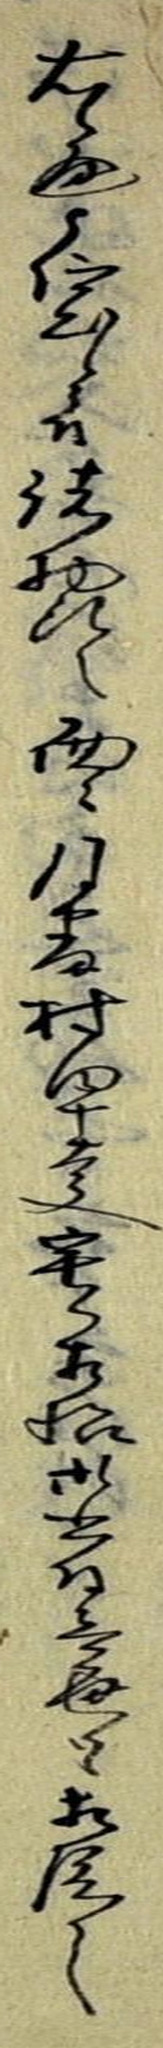右之通被仰出候に付諸物頭之面々月番村田十太夫宅へ相招御書付壱通つヽ相渡之
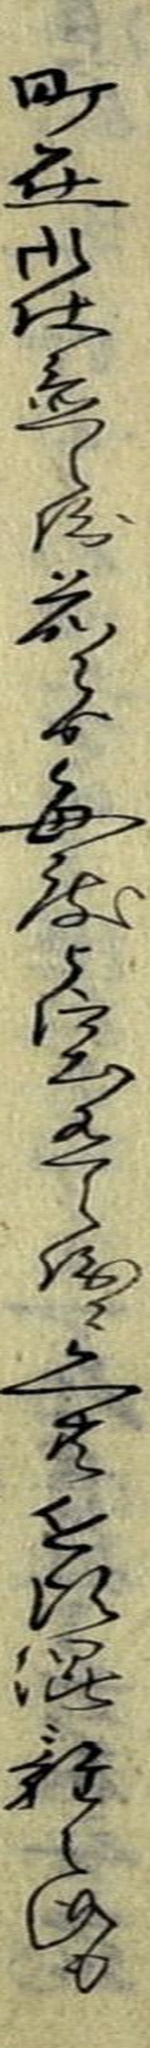町在御仕置之儀前々ゟ毎度被仰出有之儀に候へ共近頃混雑之趣も
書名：命令之部 四
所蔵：福井県文書館 Fukui Prefectural Archives
